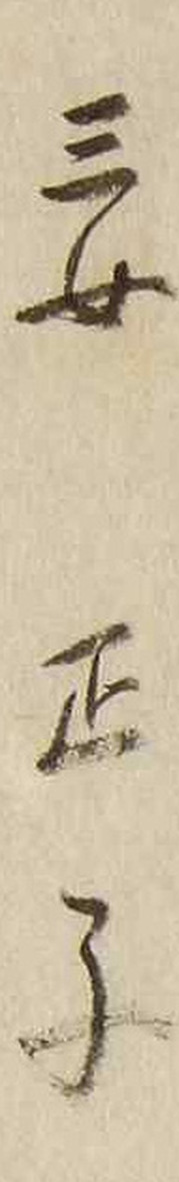三女正子

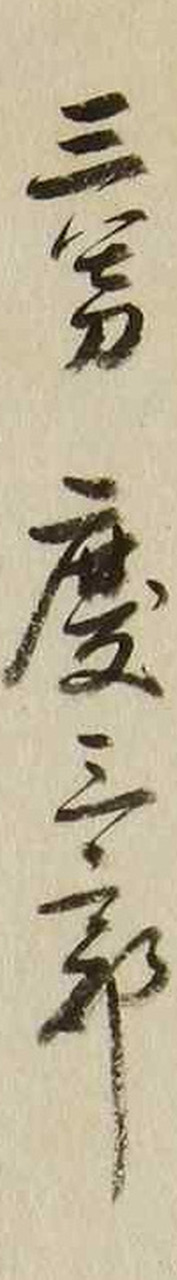三男慶三郎
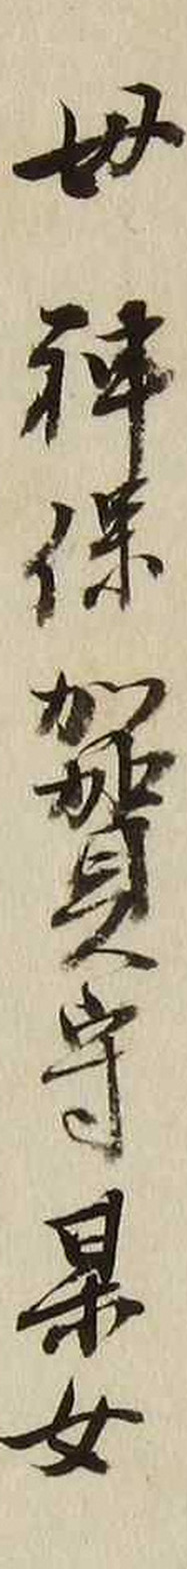母神保加賀守某女
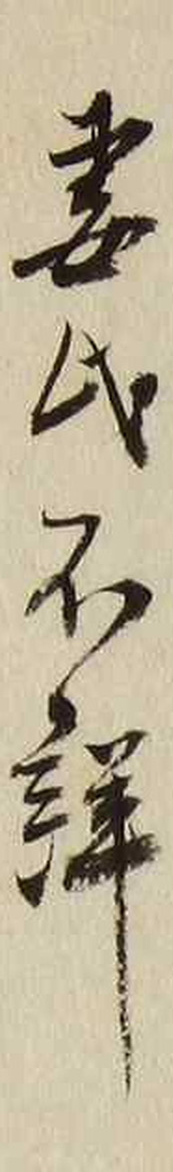妻氏不詳
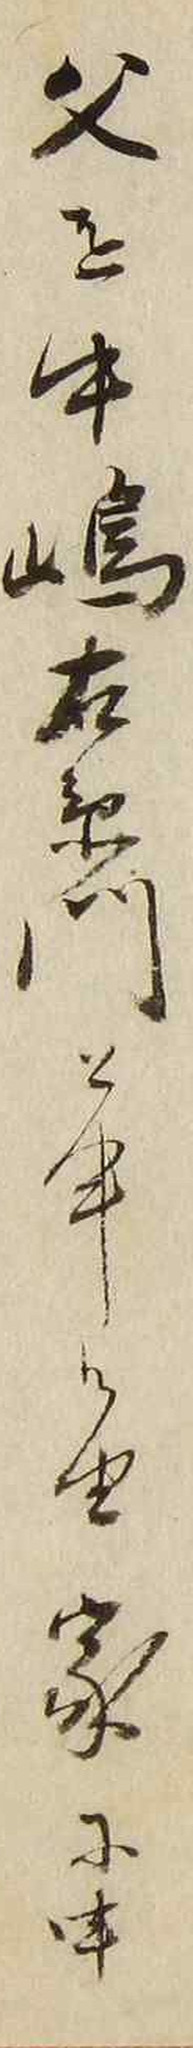父を中島右衛門と申候由家等申
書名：諸士系譜　巻之311　し之部1
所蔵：会津若松市立会津図書館
